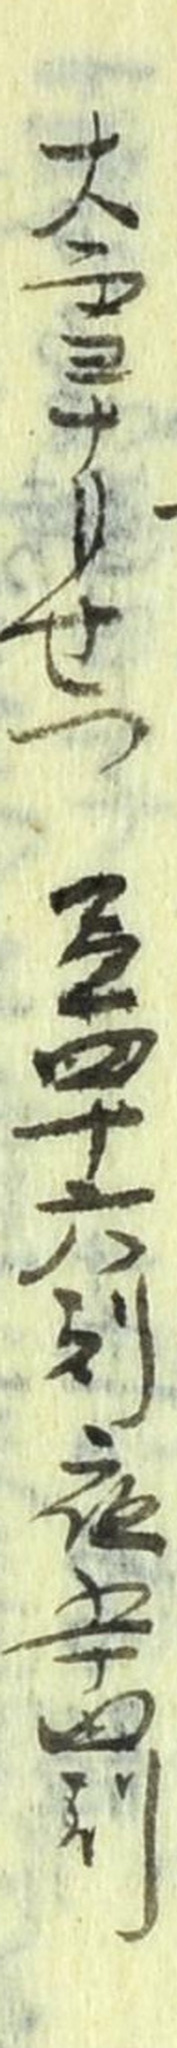大雪十月せつ昼四十六刻夜五十四刻
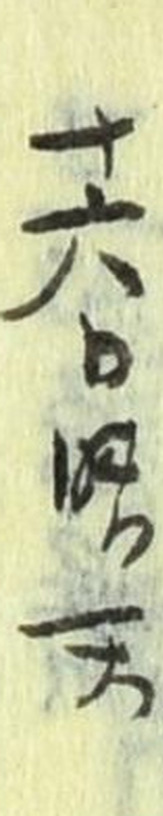十五日晴天
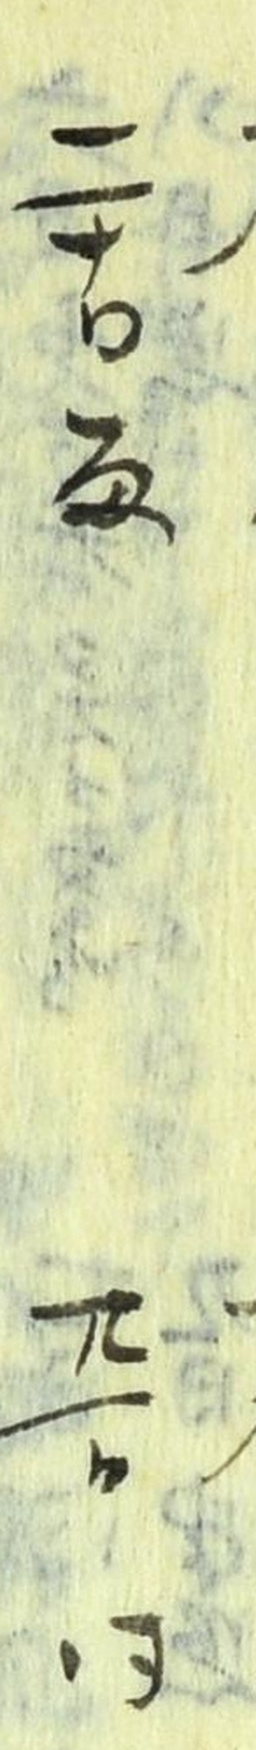二十日雨廿一日同
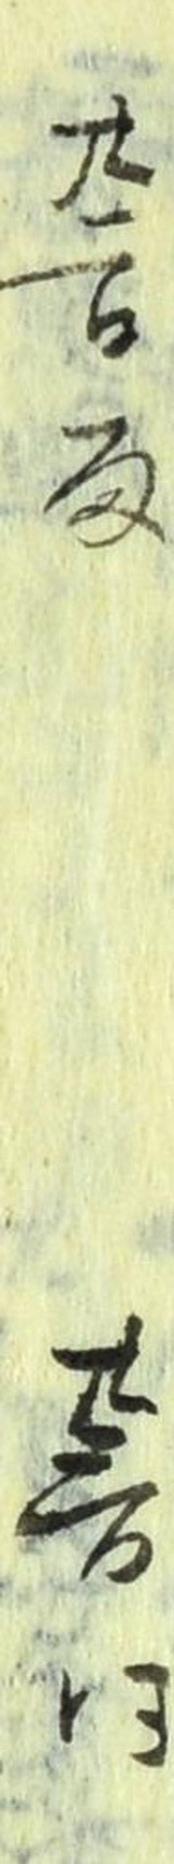廿二日雨廿三日同
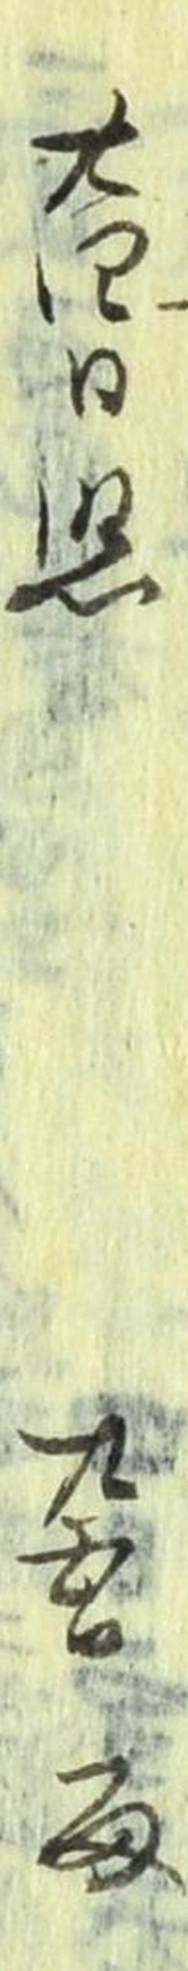廿四日照廿五日雨
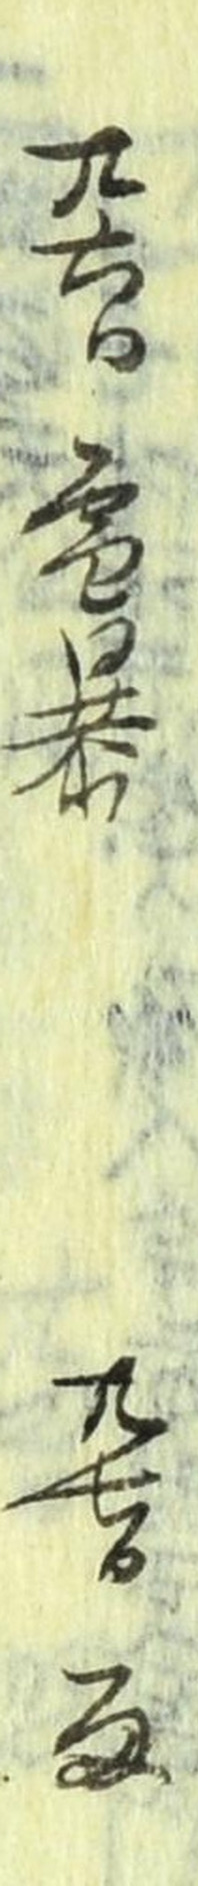廿六日雪暴廿七日雨
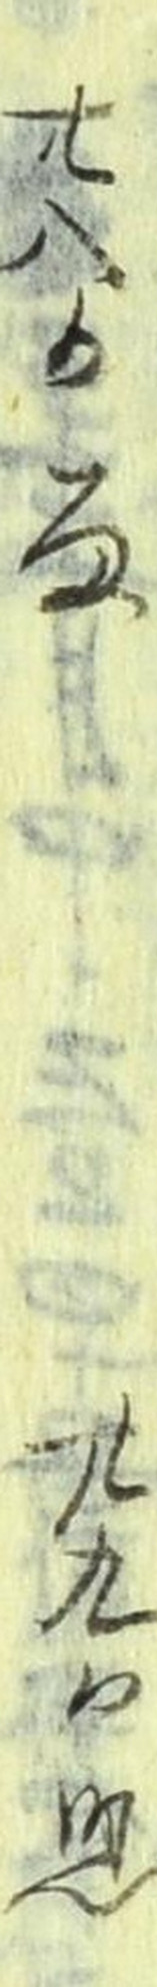廿八日雨廿九日照
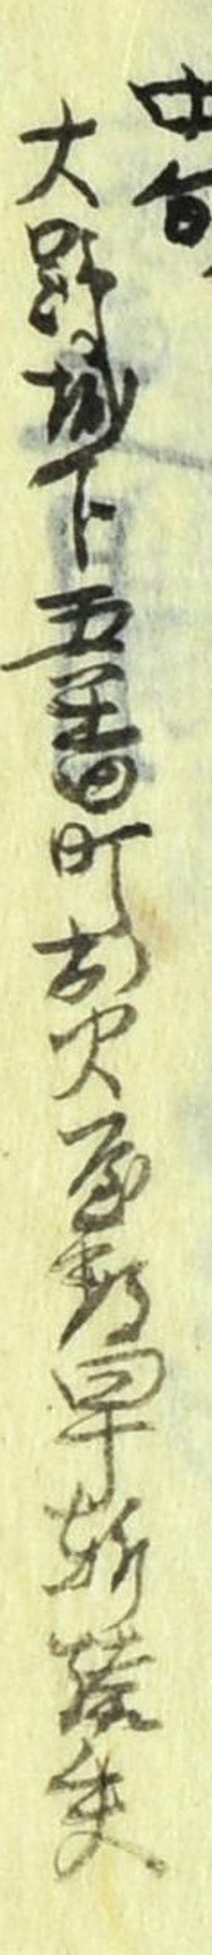大野城下五番町出火屋数四十軒焼失

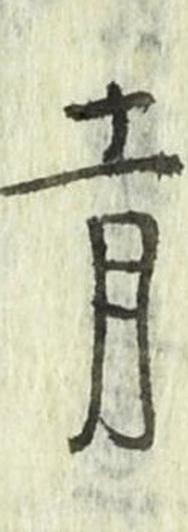十一月
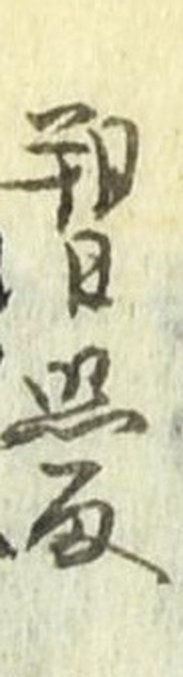朔日照雨
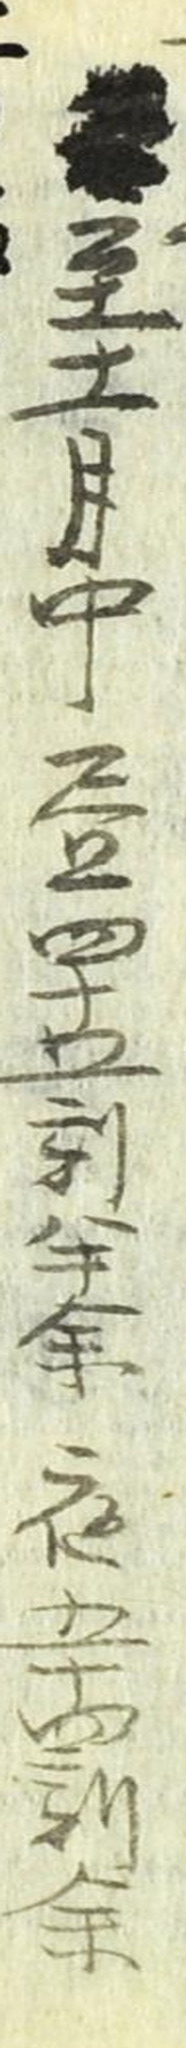】至十一月中昼四十五刻半余夜五十四刻余
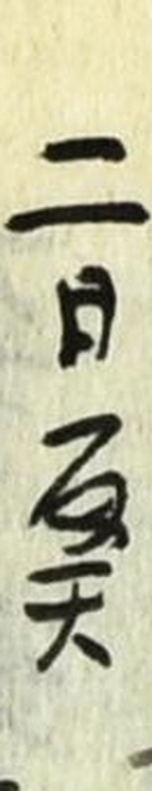二日雨天
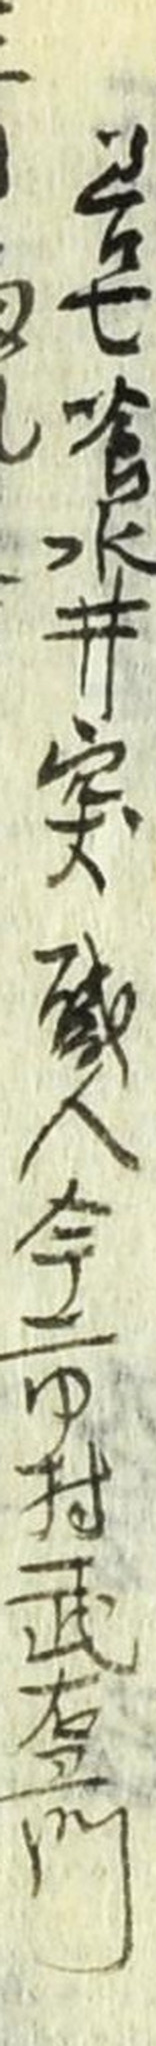善七喰水井突職人今市村武右ヱ門
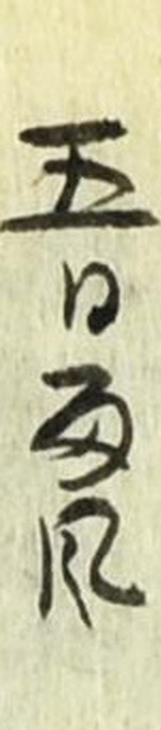五日雨天
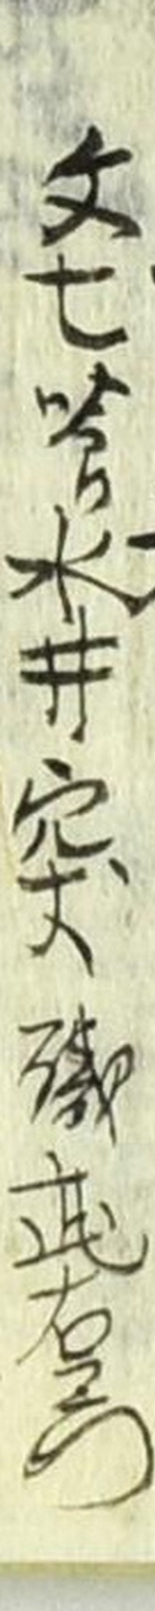文七喰水井突職武右ヱ門
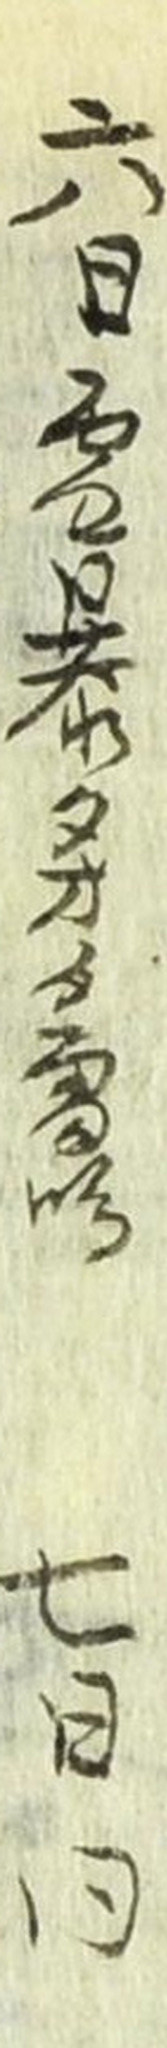六日雪暴夕方ゟ雷鳴七日同
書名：（日記）
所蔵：福井県文書館 Fukui Prefectural Archives
